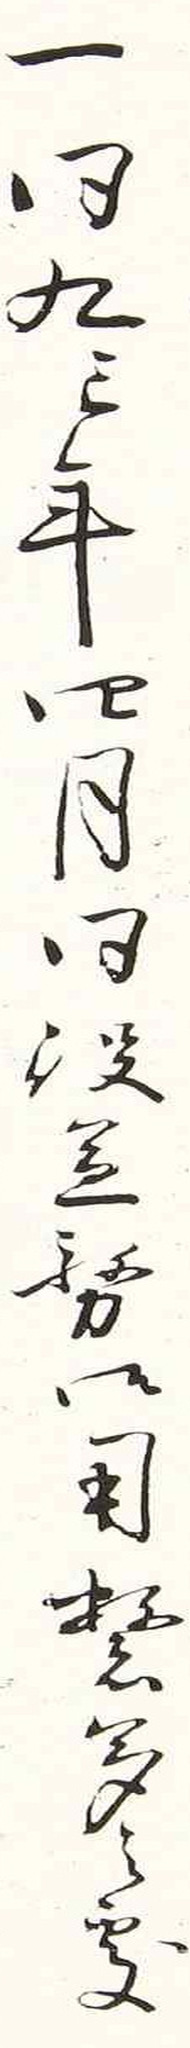一同九巳年四月同役兼務御用繁多之処
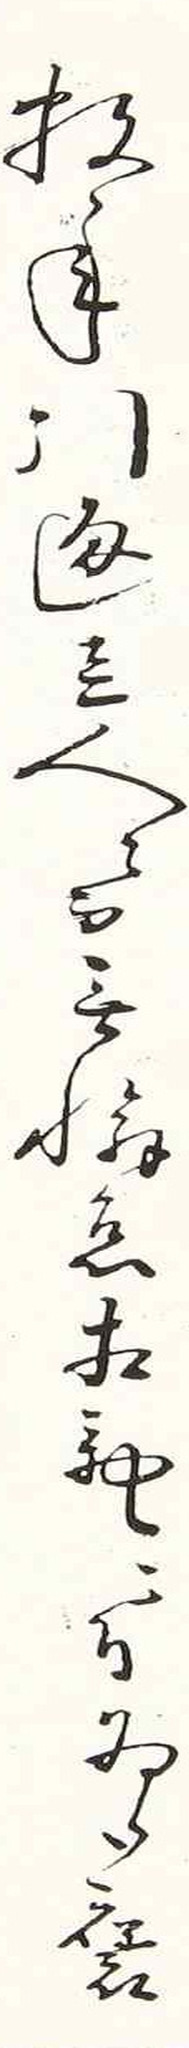数年引通壱人ニ而無懈怠相勤候ニ付為御褒
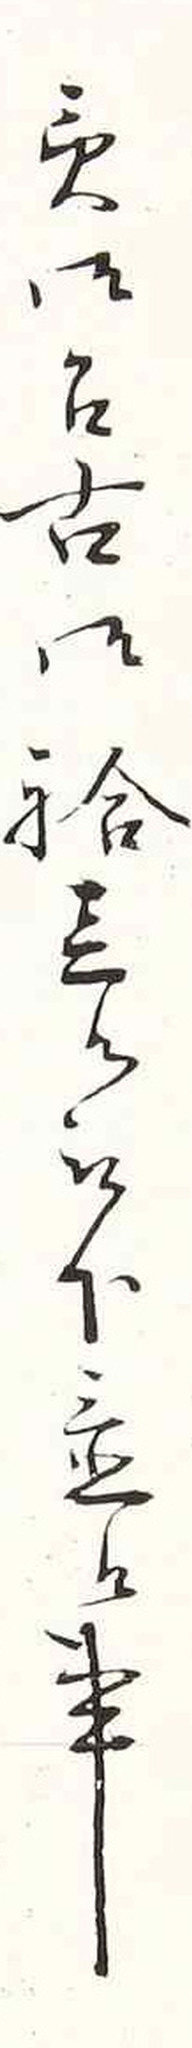美御召古御袷壱ツ被下置候事
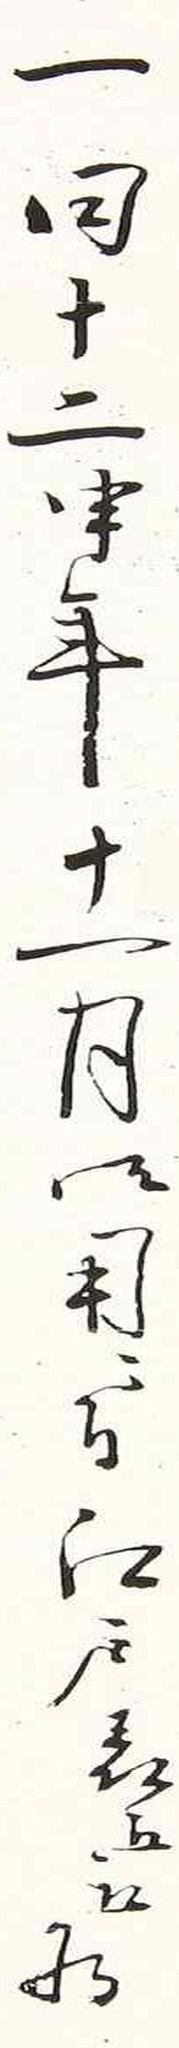一同十二申年十一月御用ニ付江戸表上江被為
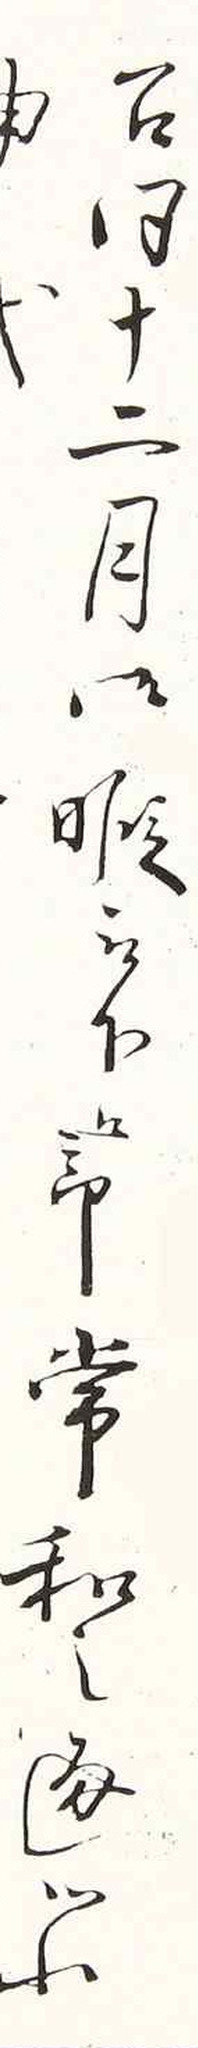召同十二月御暇被下候節常和之通御小
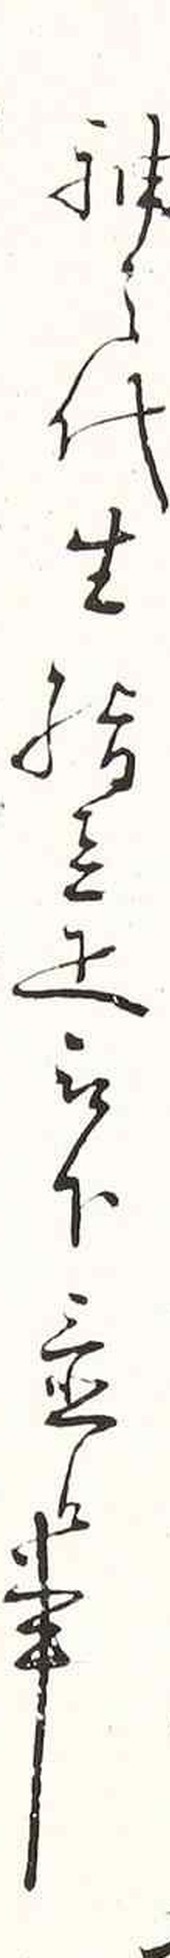袖之代生絹壱疋被下置候事
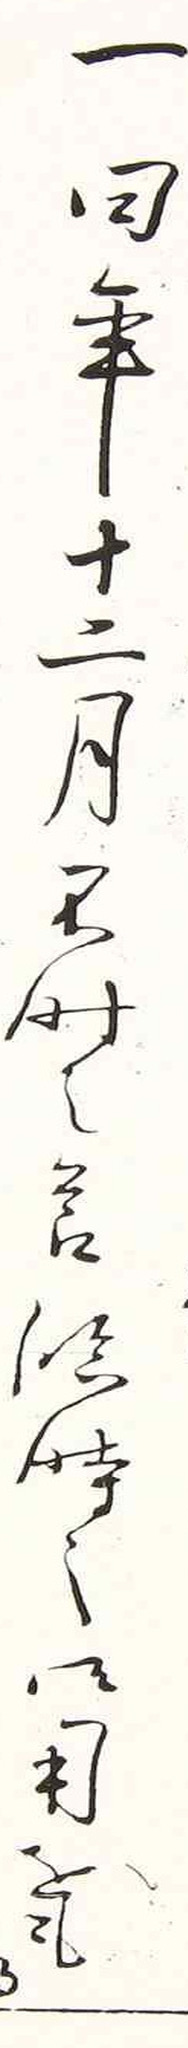一同年十二月不時之節臨時之御用をも為
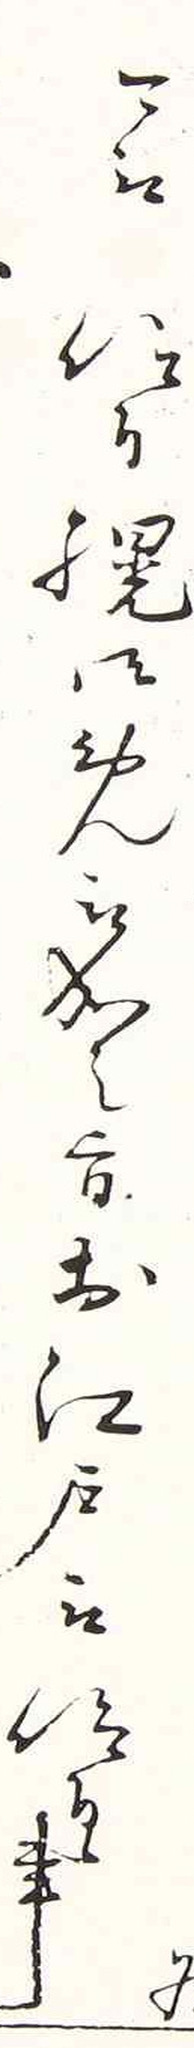可被仰付縨御免被成之旨於江戸被仰付候事
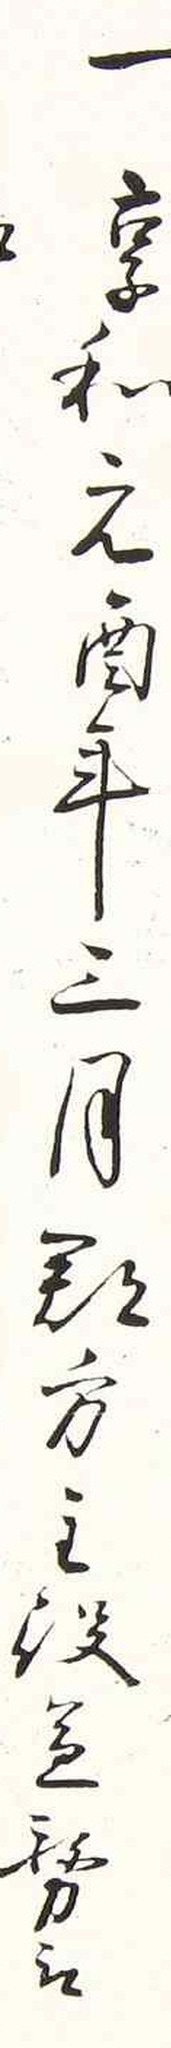一享和元酉年三月郡方主役兼務被
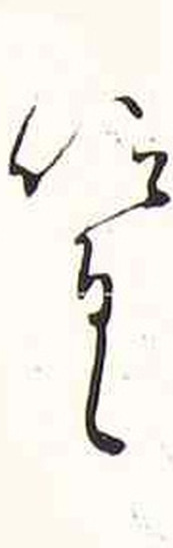仰付候
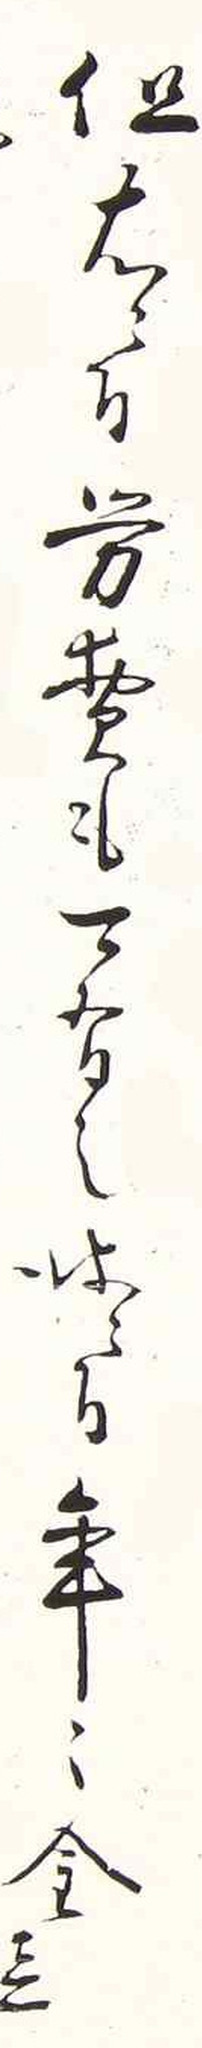但右ニ付労費も可有之儀ニ付年々金壱
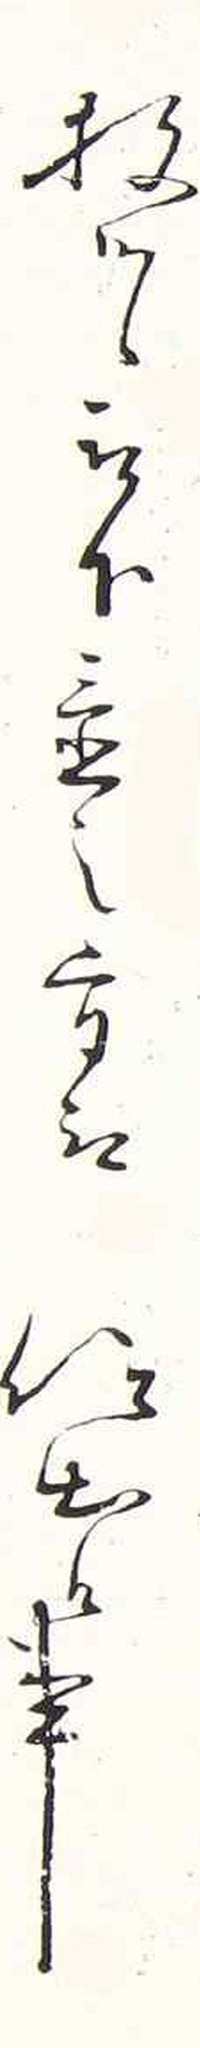枚ツヽ被下置之旨被仰出候事
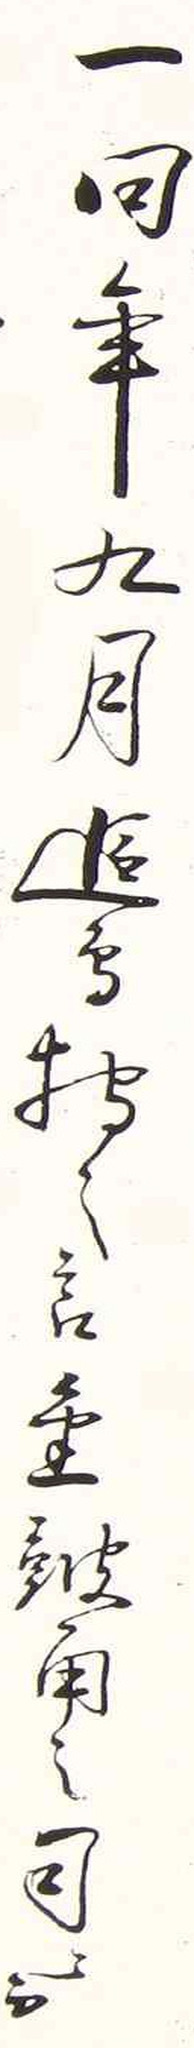一同年九月追鳥狩之節金鼓角之司ニ而
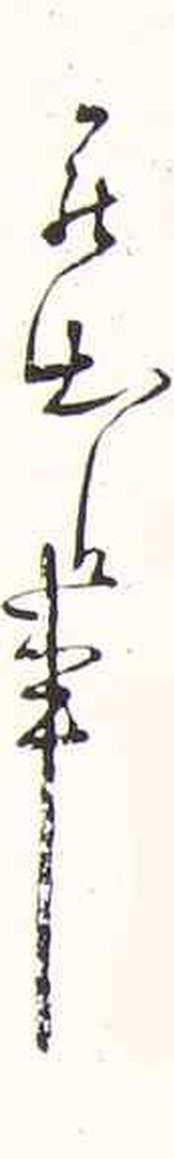罷出候事

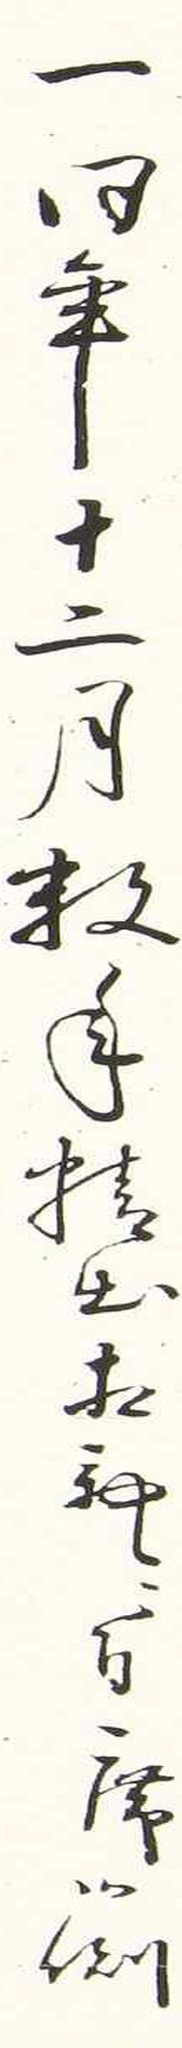一同年十二月数年精出相勤候ニ付席御例
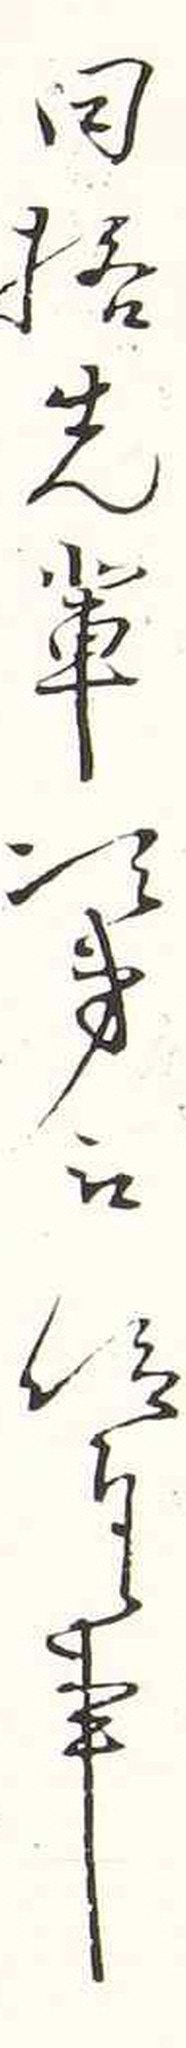同格先輩次第被仰付候事
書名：諸士系譜　巻之357　す之部7
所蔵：会津若松市立会津図書館
